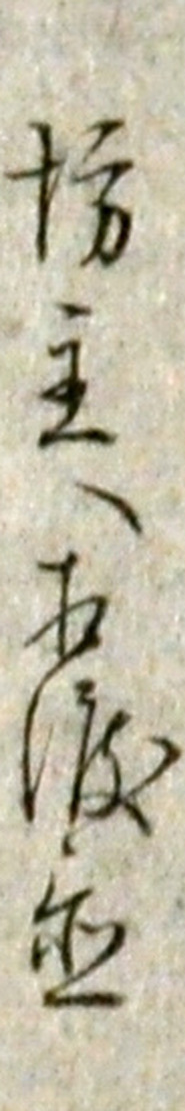坊主へ相渡置
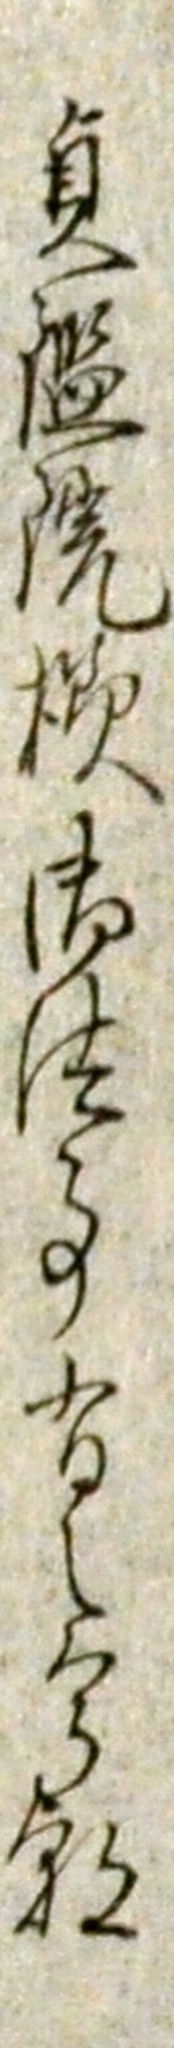貞鑑院様御法事有之今朝
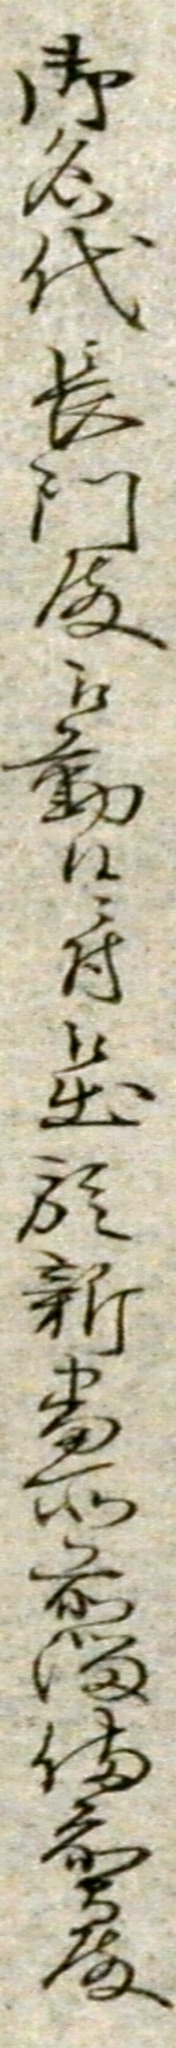御名代長門殿江勤候ニ付被出於新番所番前溜備前守殿
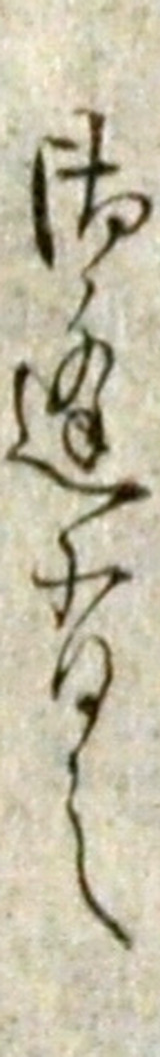御逢有之
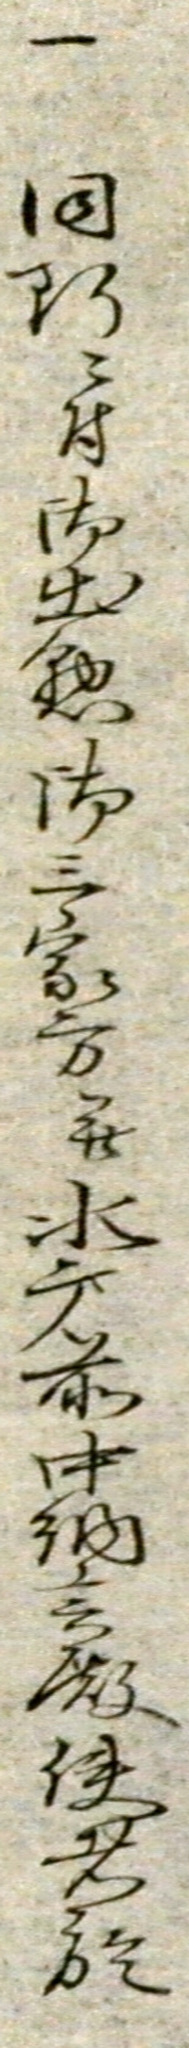一同断ニ付御出懸御三家方幷水戸前中納言殿使者於
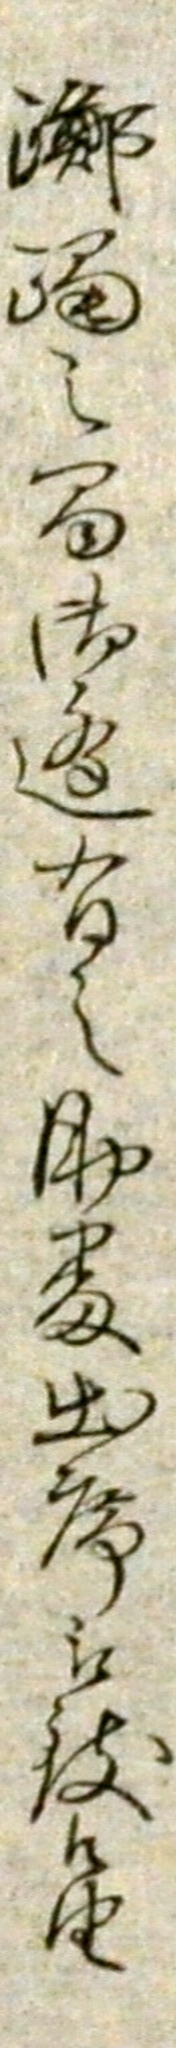躑躅之間御逢有之助番出席被致候由
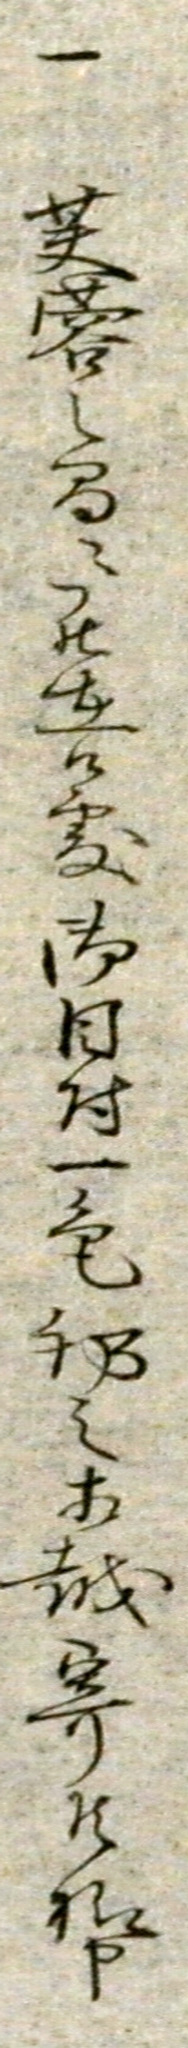一芙蓉之間ニ罷在候処御目付一色邦之相越寄候様申
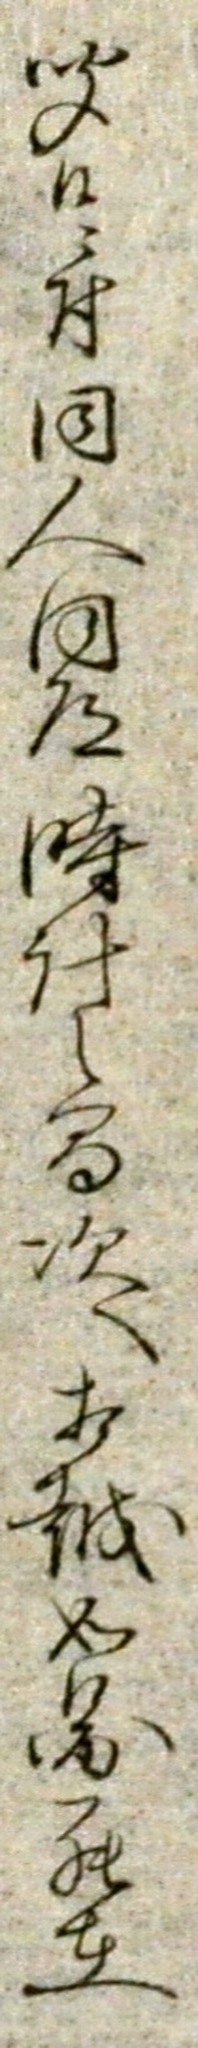聞候ニ付同人同道時計之間次へ相越如図罷在
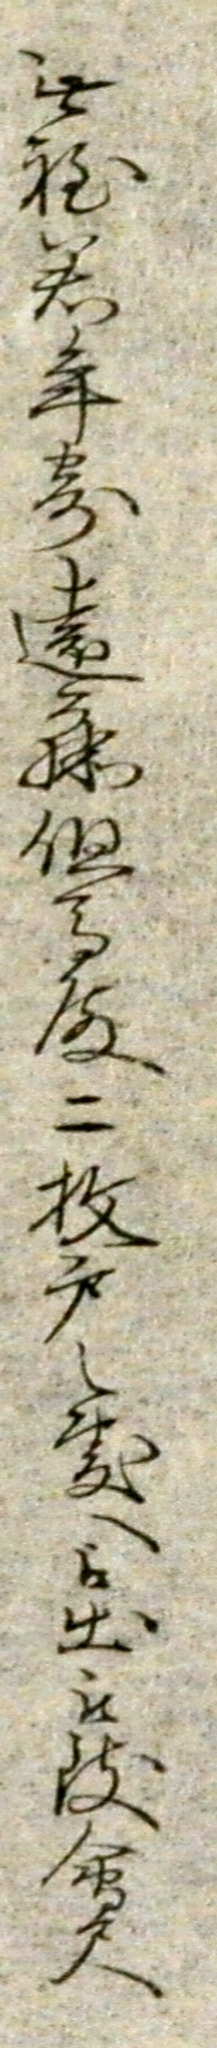一無程若年寄遠藤但馬殿二枚戸之処へ被出被致会尺
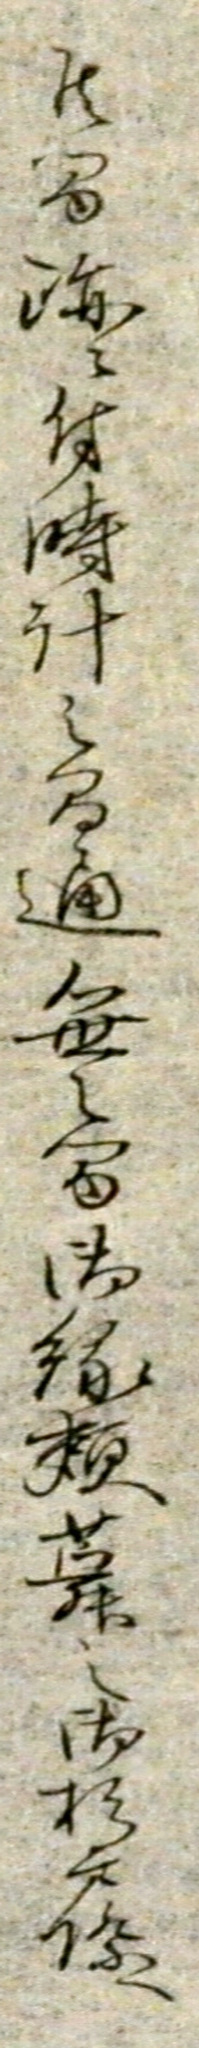候間跡ニ付時計之間通無之間御縁類葬之御杉戸際へ
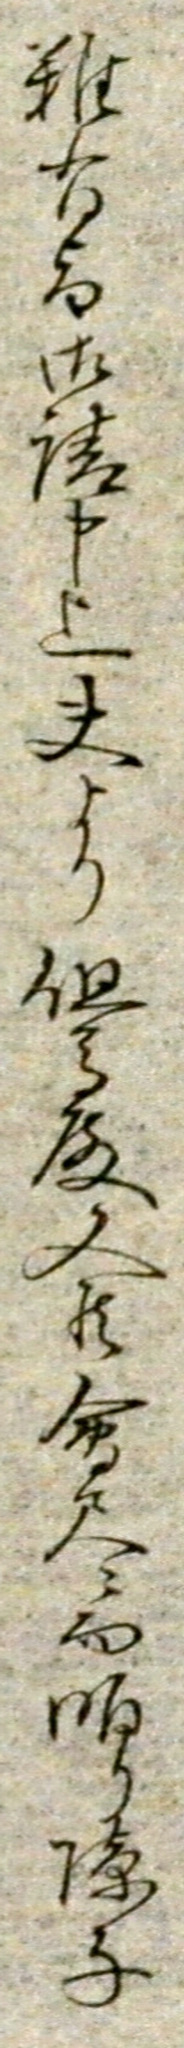難有旨御請申上夫より但馬殿人共会尺ニ而明り障子
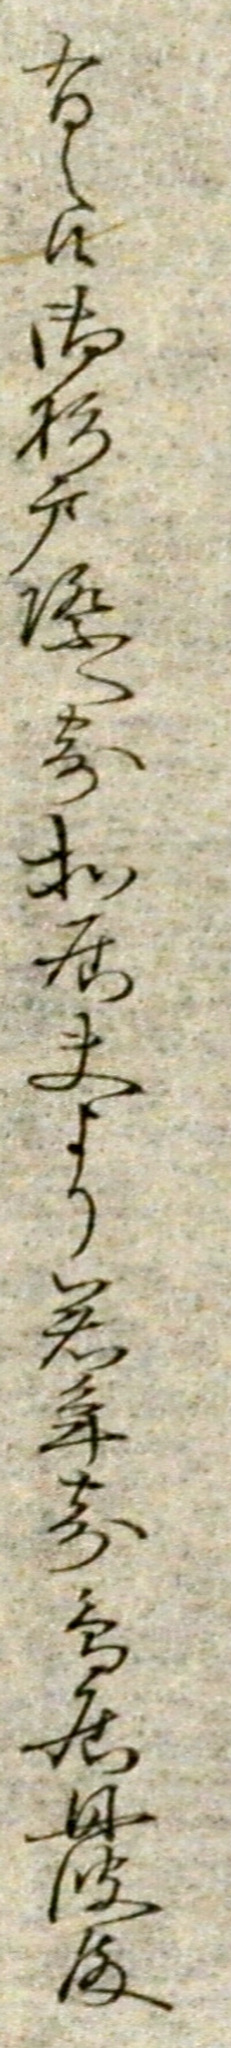有之候御ニ杉戸際へ寄扣居夫より若年寄鳥居丹波殿
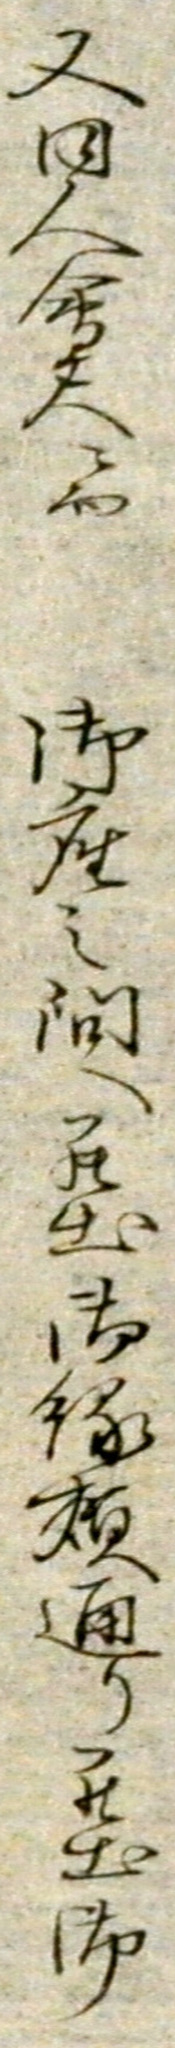又同人会尺ニ而御座之間へ罷出御縁頬通り罷出御
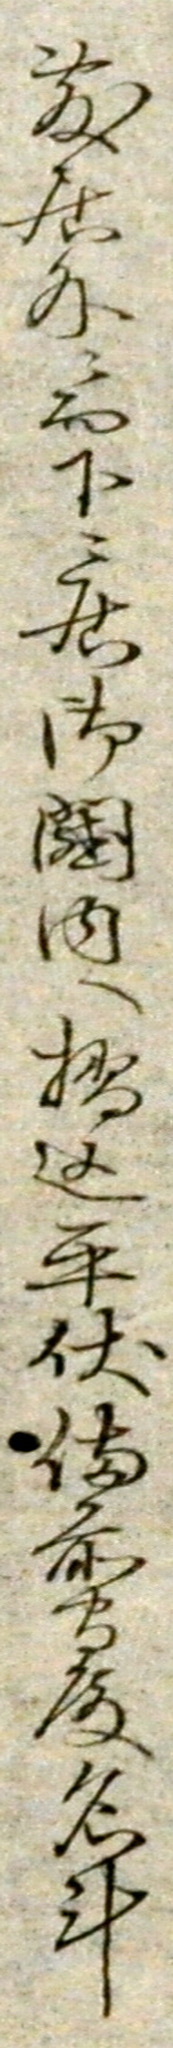敷居外ニ而下ニ居御閾内へ摺込平伏備前守殿名斗
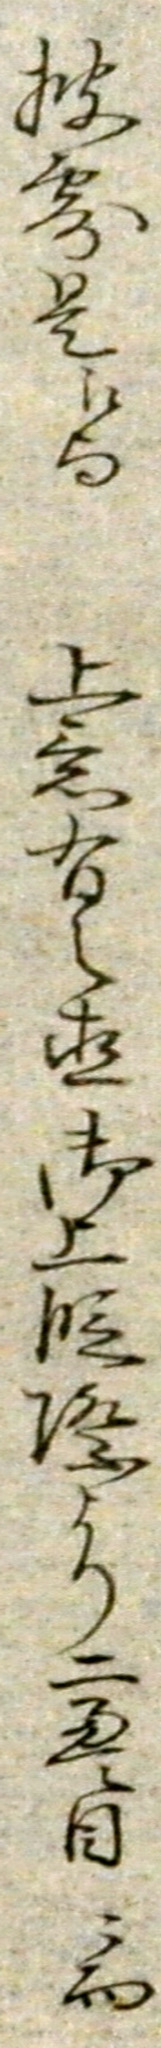披露是江与上意有之直御上段際より二畳目ニ而
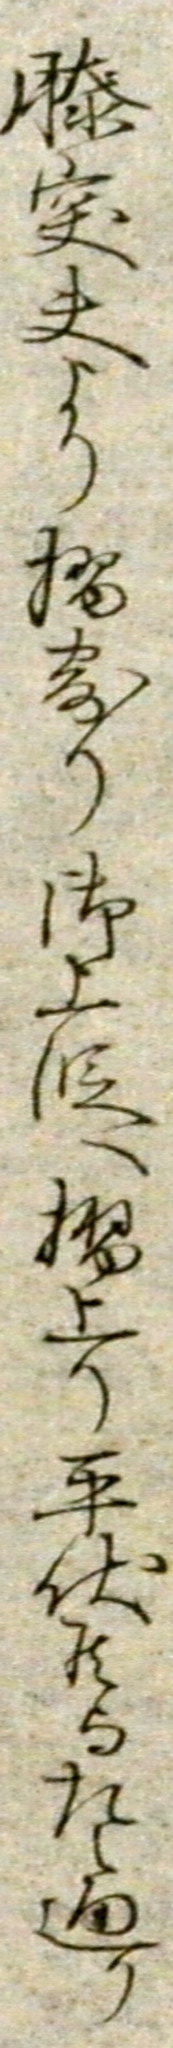膝突夫より摺寄リ御上段へ摺上り平伏候与左之通り
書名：日光御名代相勤候節ノ留
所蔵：伊那市立高遠町図書館・合同会社AMANE
